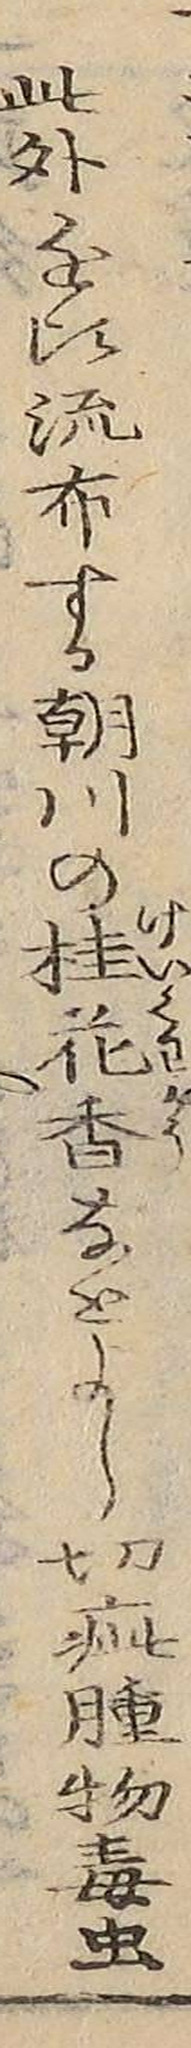此外近頃流布する朝川の桂花香なとよし切疵腫物毒虫
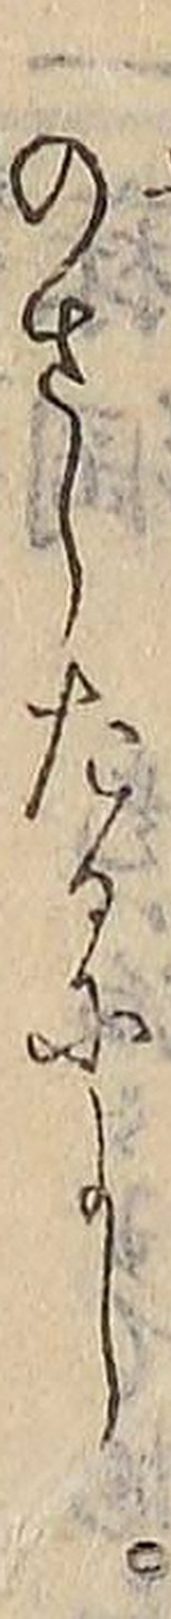のさしたるによし
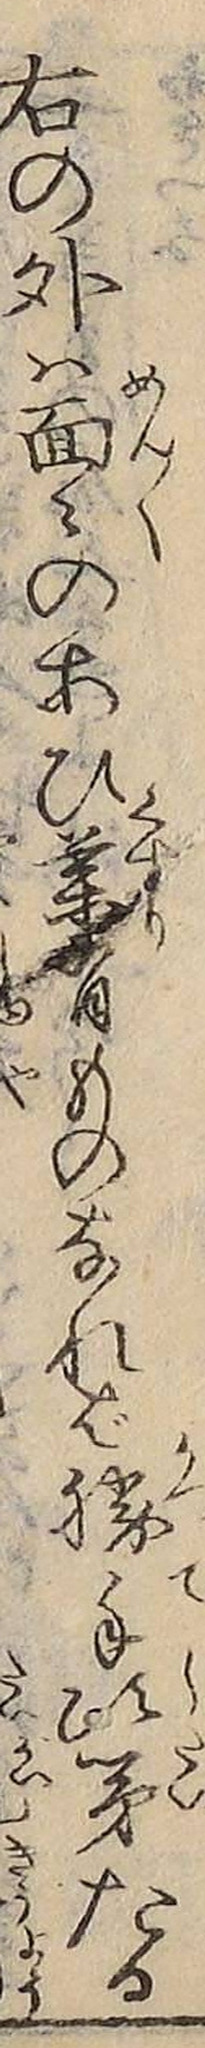右の外は面々のあひ薬有ものなれば勝手次
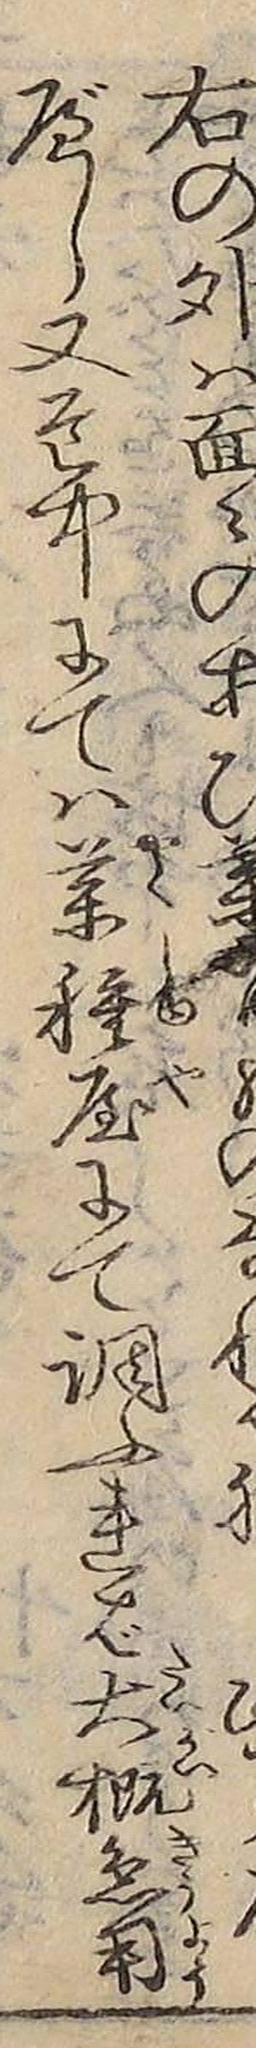べし又道中にては薬種屋にて調ふれば大概急用
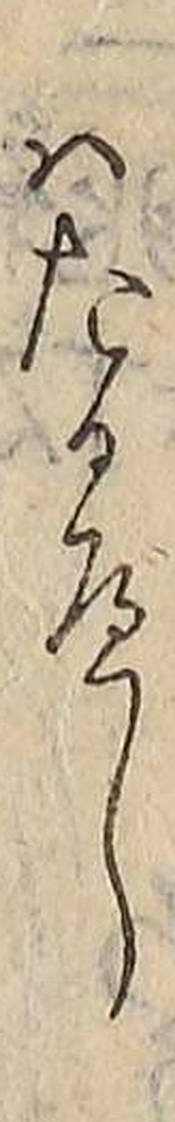はたるべし
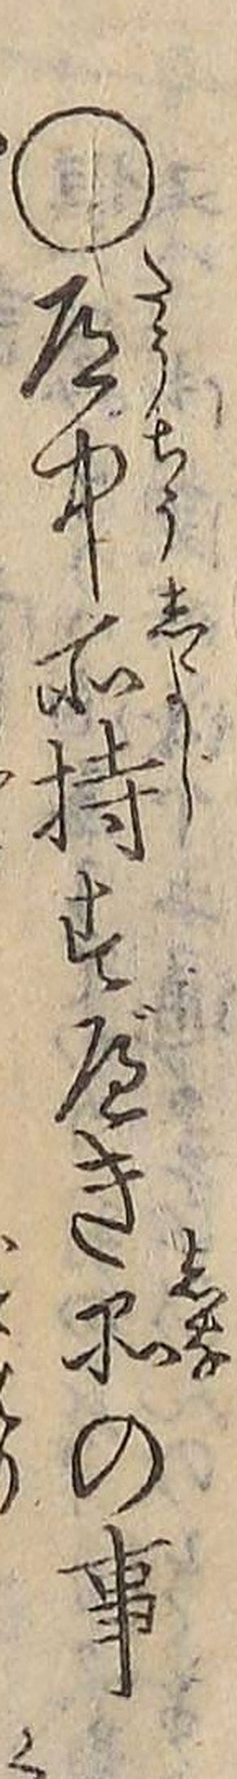○道中所持すべき品の事

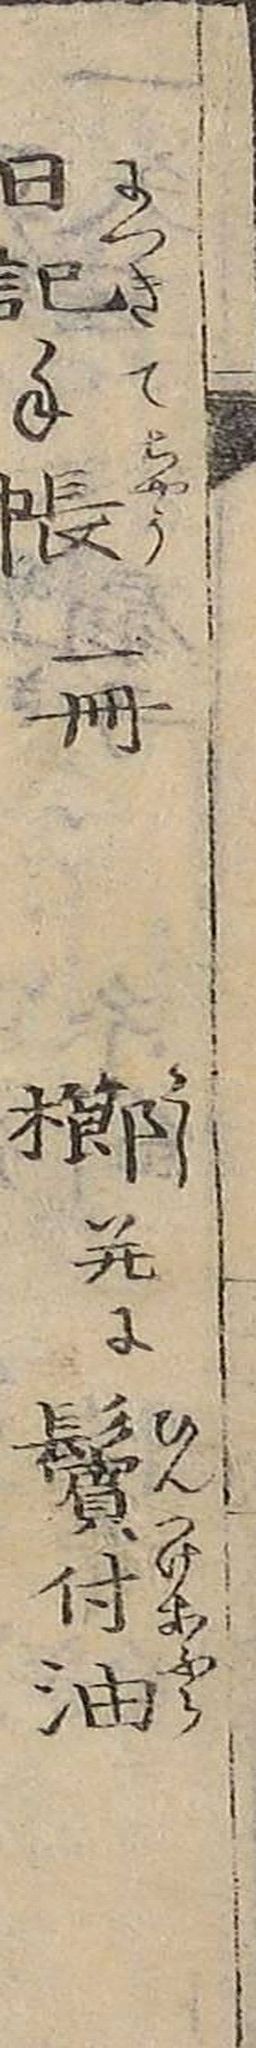日記手帳一冊櫛并鬢付油
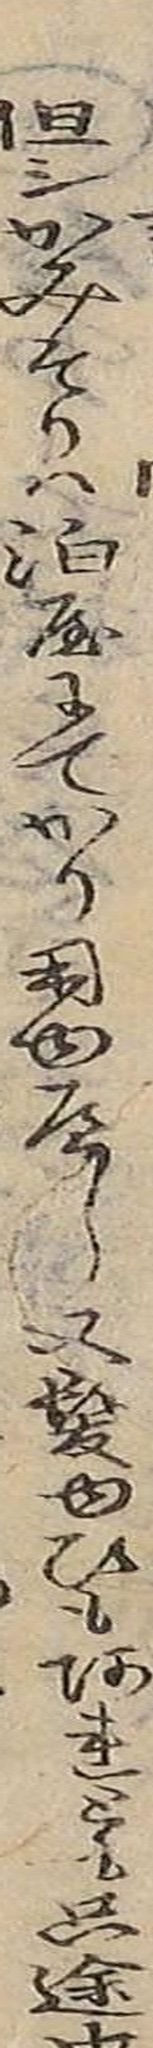但しかみそりは泊屋にてかり用ゆへし又髪ゆひもあれとも只途中
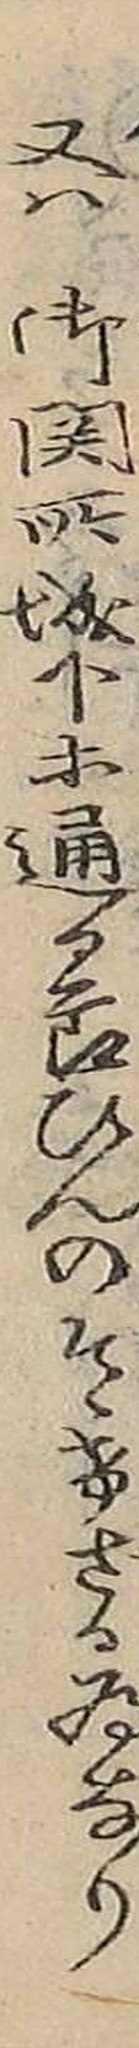又は御関所城下等通る節ひんのそゝけざる為なり
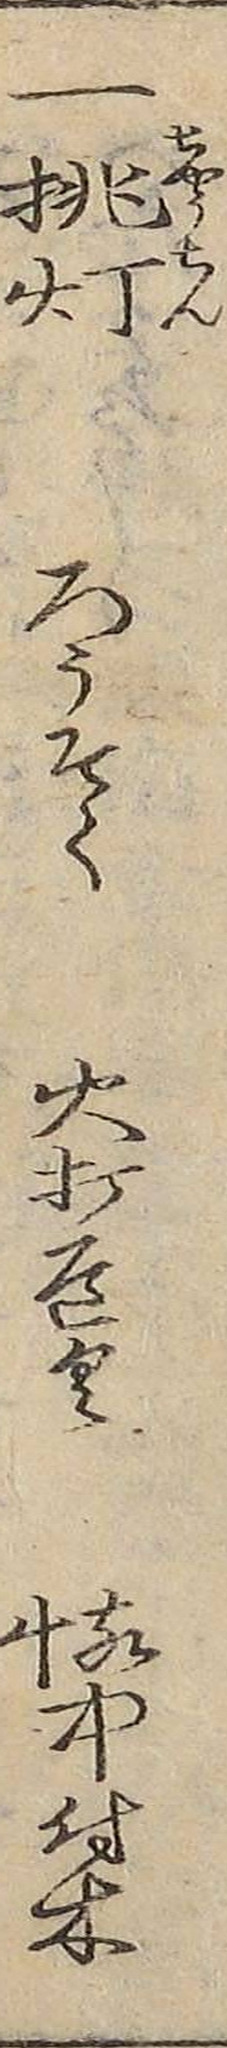一挑灯ろうそく火打道く懐中付木
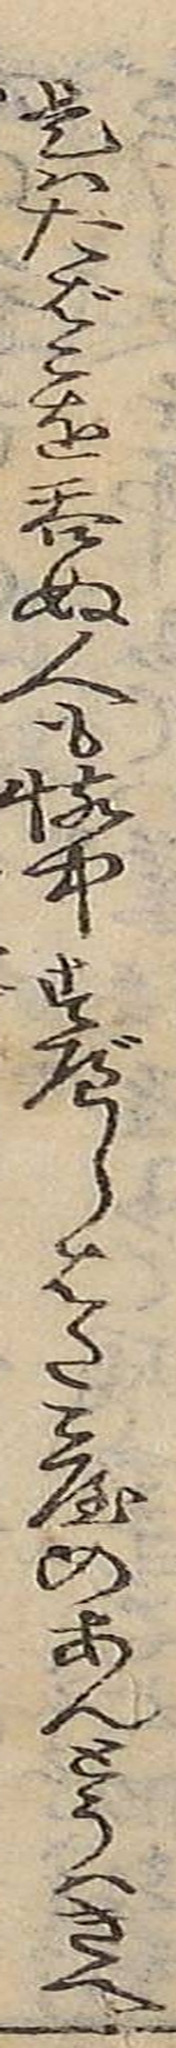是はたばこを呑ぬ人も懐中すべしはたこ屋のあんとうはきへ
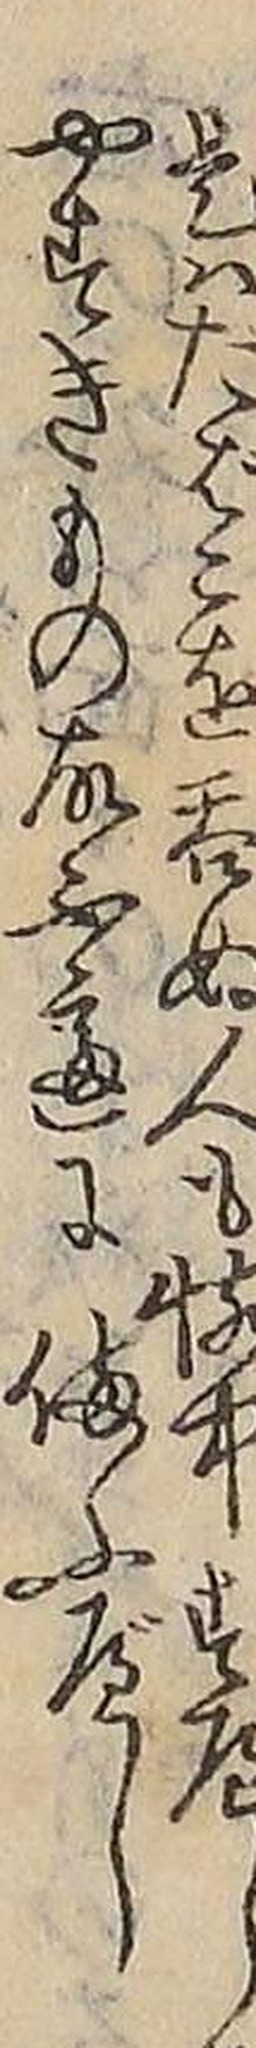やすきもの故ふ慮に備ふべし
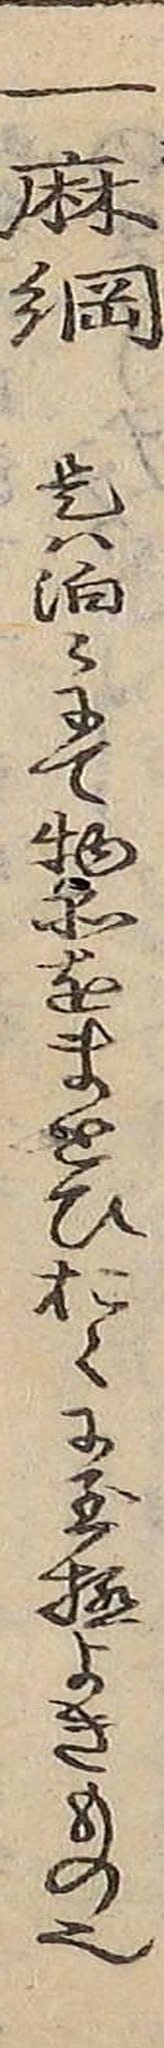一麻綱是は泊々にて物品をまとひおくに至極よきもの也
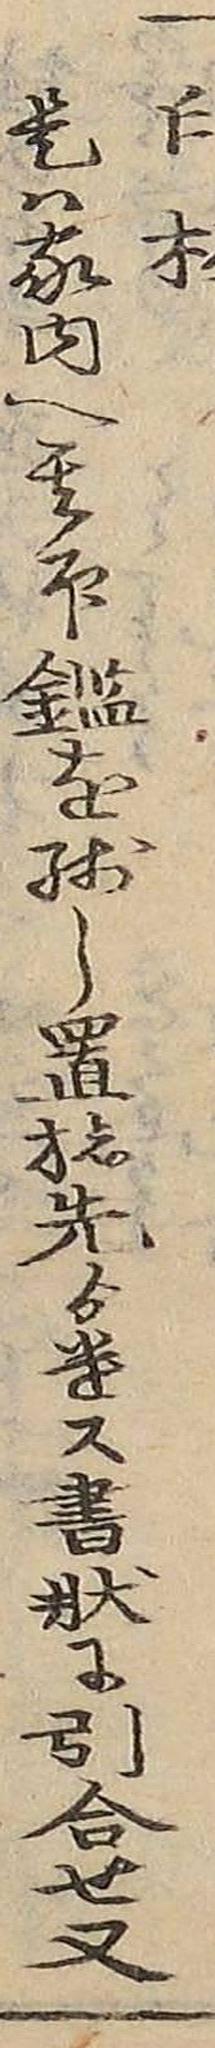是は家内へ其印鑑を残し置旅先ゟ遣ス書状に引合せ又
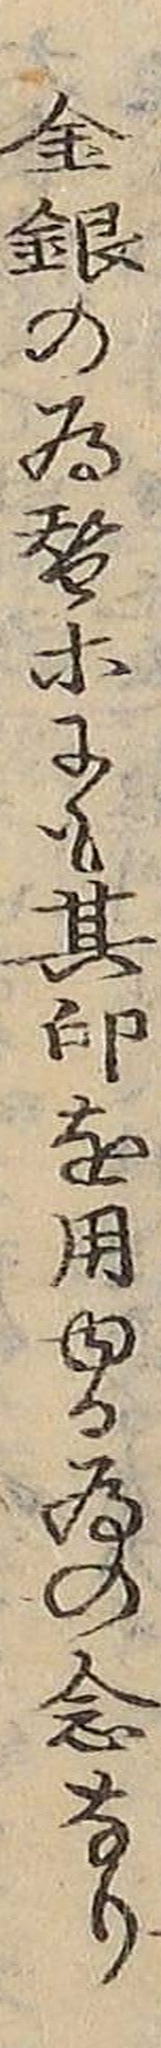金銀の為替等にも其印を用ゆる為の念なり
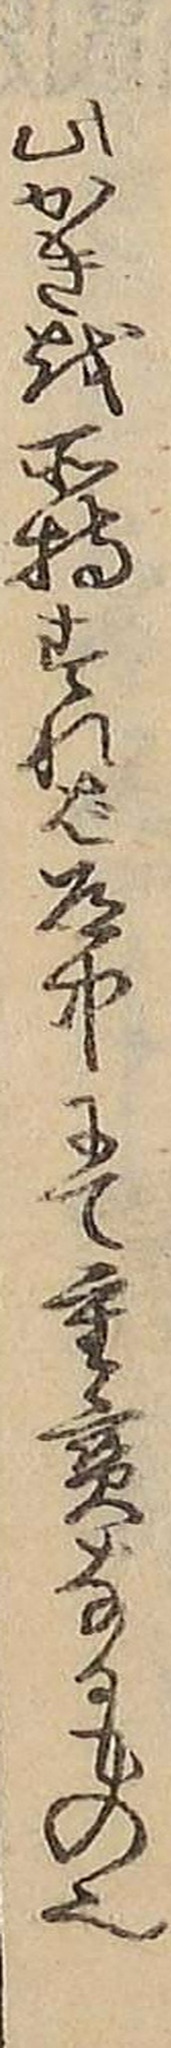一此かきを所持すれば道中にて重実なるもの也
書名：旅行用心集
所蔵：神戸大学附属図書館 国文学研究資料館
